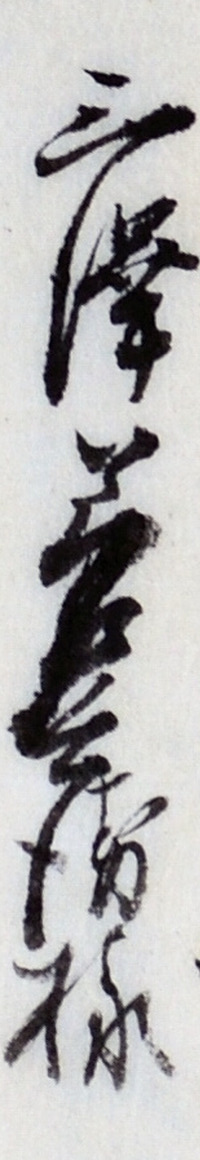三沢善兵衛様
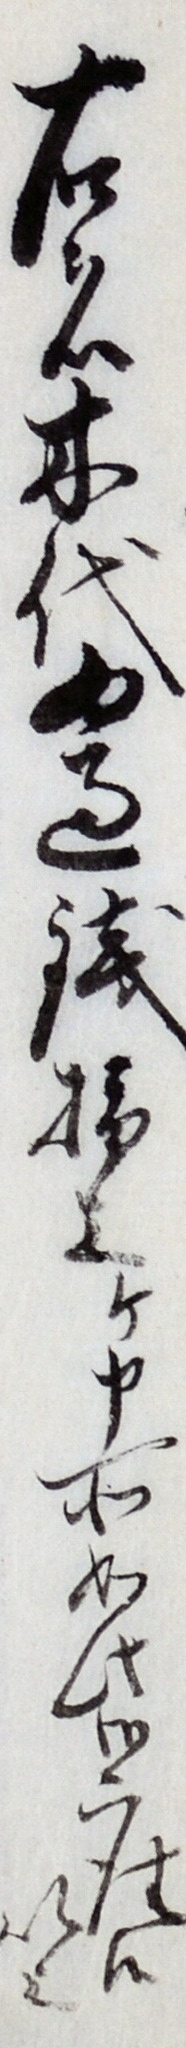右者木代為過銭指上ヶ申所如此御座候以上

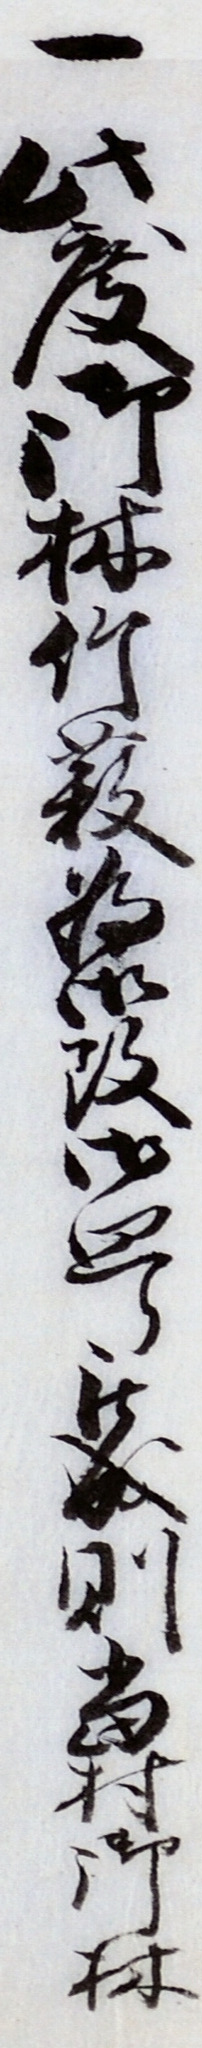一此度御林竹薮為御改御廻り被成則当村御林
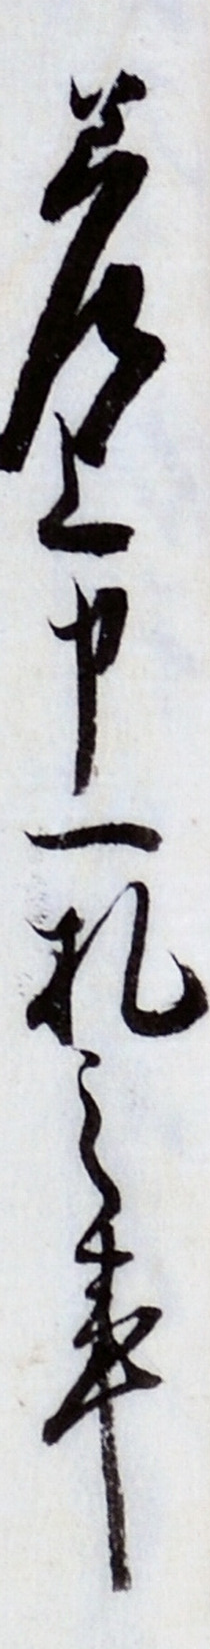差上申一札之事
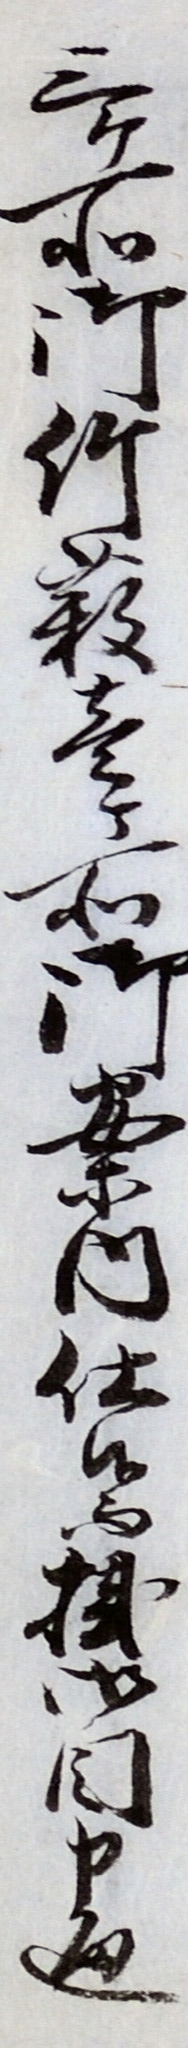三ヶ所御竹薮壱ヶ所御案内仕候而掛御目申通
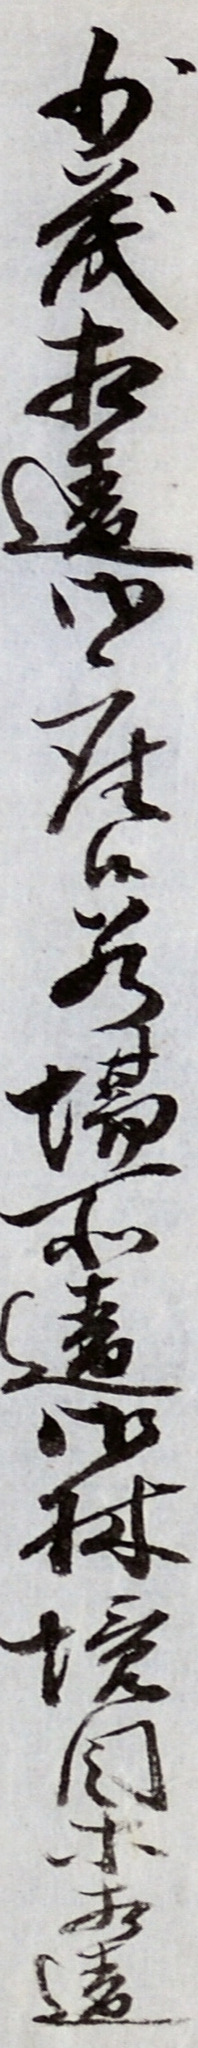少も相違御座候若場所違御林境目等相違
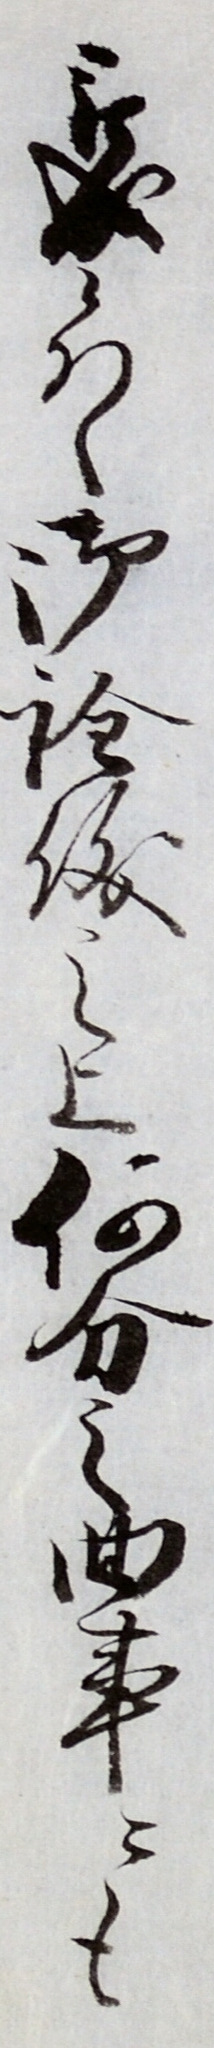被成候ハヽ御詮儀之上何分之曲事ニも
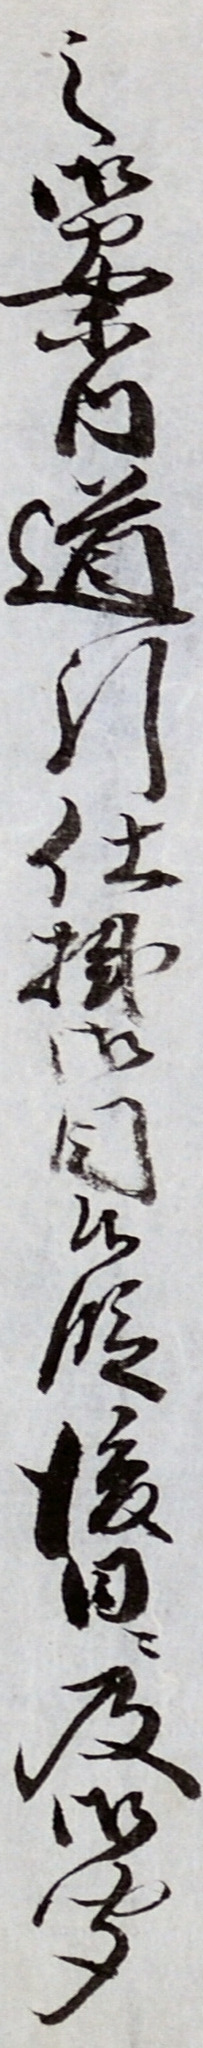之御案内道引仕掛御目候段後日ニ及御聞
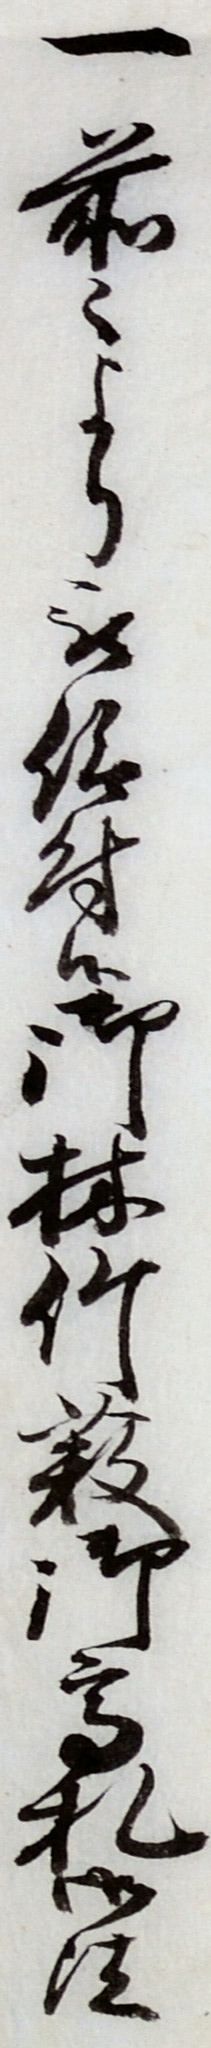一前々より被仰付候御林竹薮御高札御法
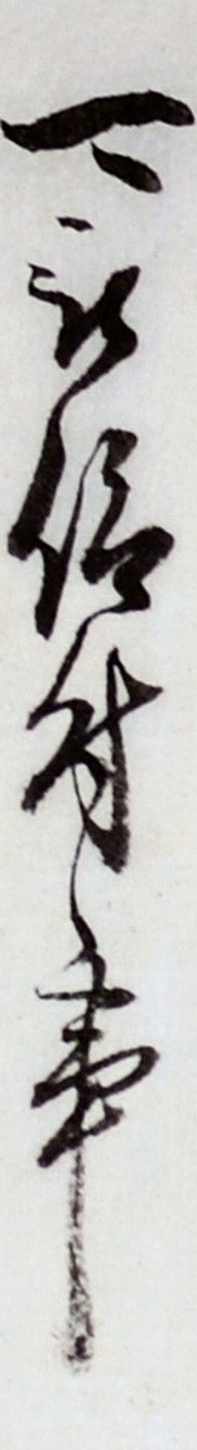可被仰付之事

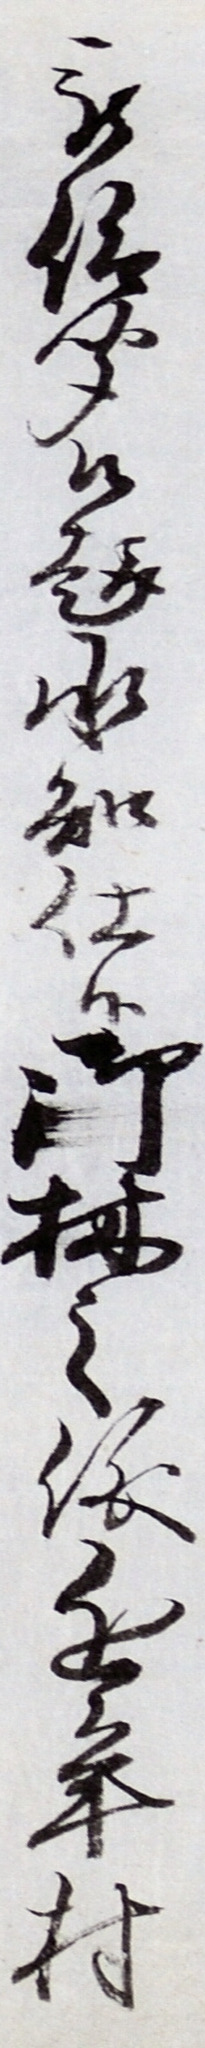被仰聞候趣承知仕候御林之儀近年村
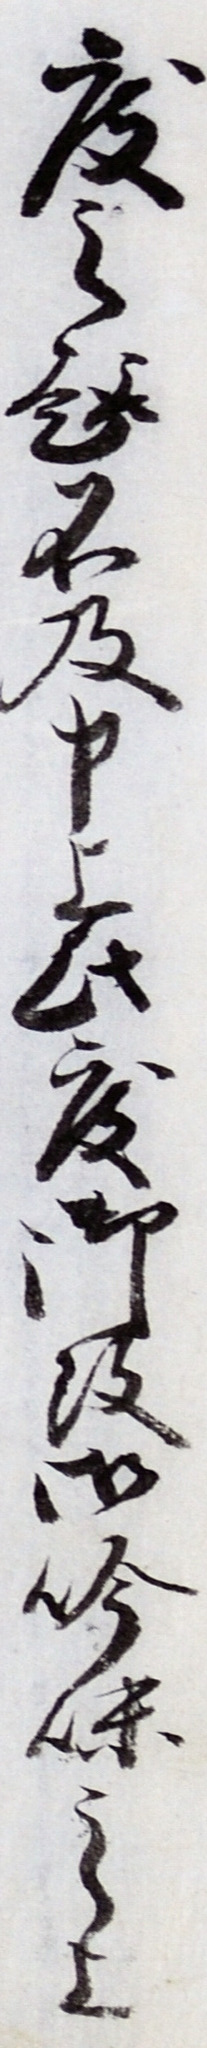度之趣不及申上此度御改御吟味之上
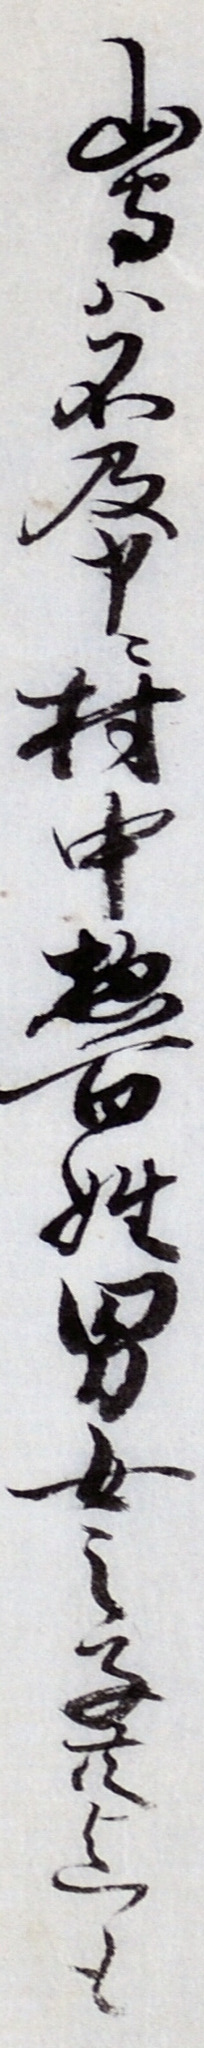山守ハ不及申ニ村中惣百姓男女之子共迄も
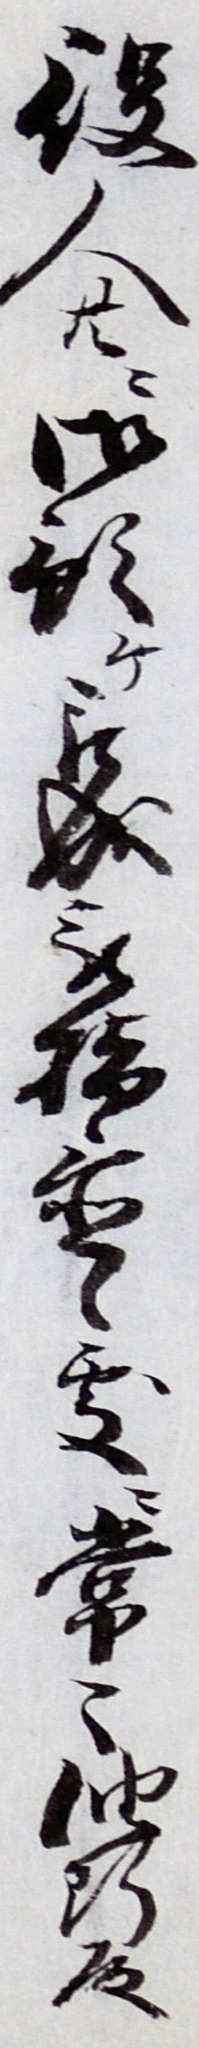役人共ニ御預ヶ被成被指置候処ニ常々油断故
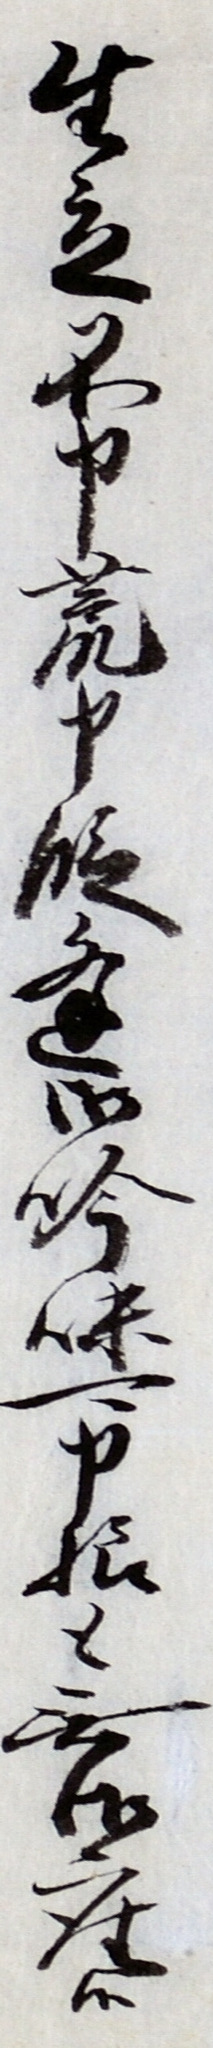生立不申荒申段逢御吟味可申様も無御座候
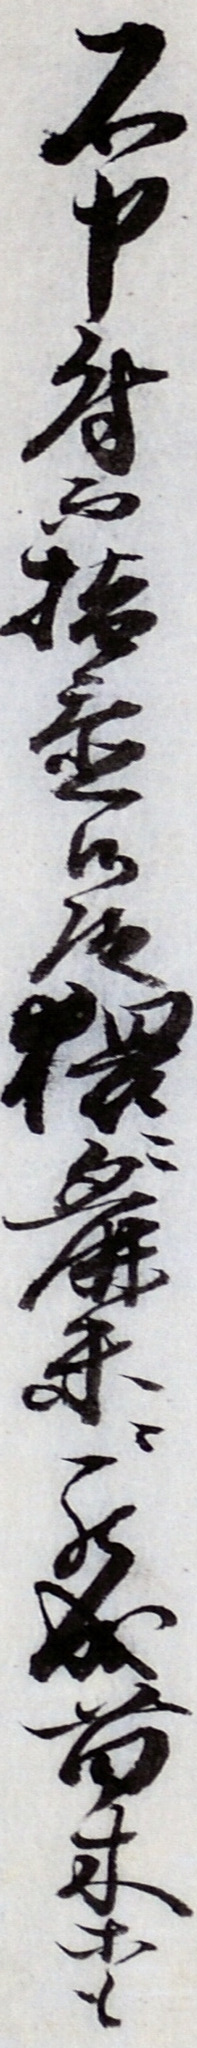不申付而指置候故猥ニ麁末ニ罷成苗木等も
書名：御林御竹藪証文控
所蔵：伊那市立高遠町図書館・合同会社AMANE
